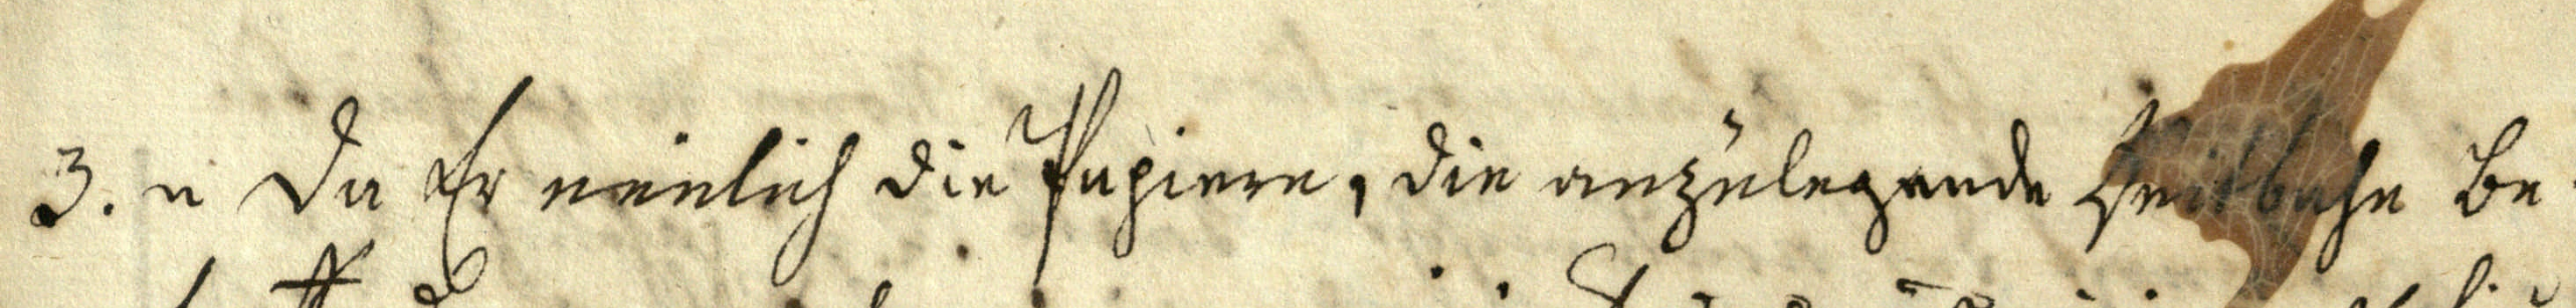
3. Da Er neulich die Papiere, die anzulegende Reitbahn be¬
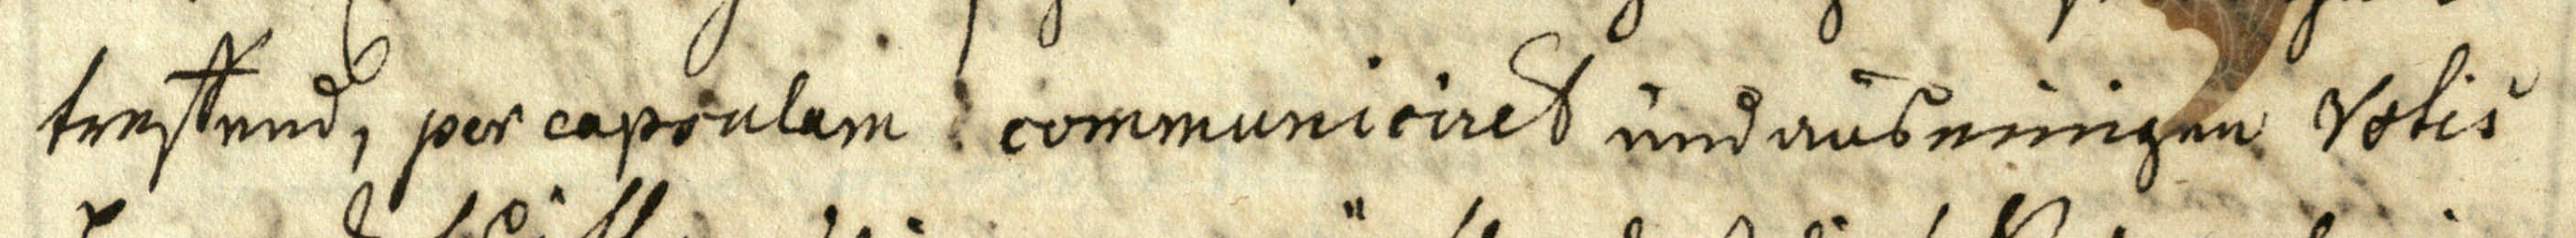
treffend, per capsulam communiciret und aus einigen votis
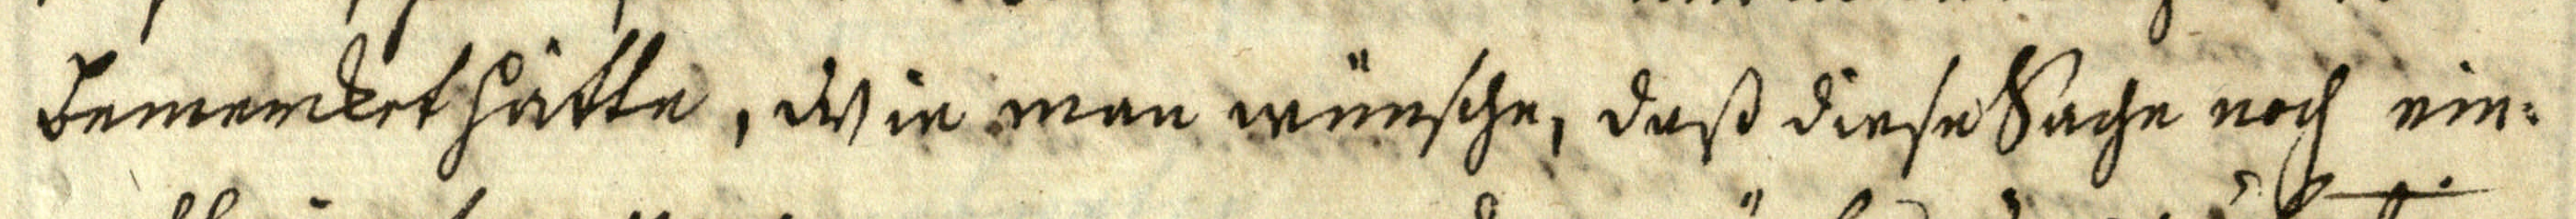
bemerket hätte, wie man wünsche, daß diese Sache noch ein¬
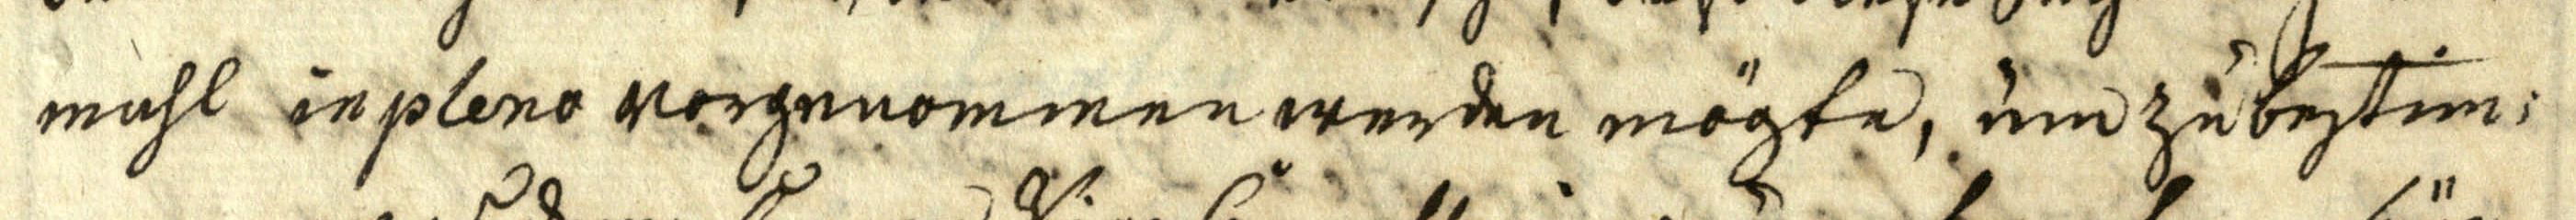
mahl in pleno vorgenommen werden mögte, dem zu bestim¬
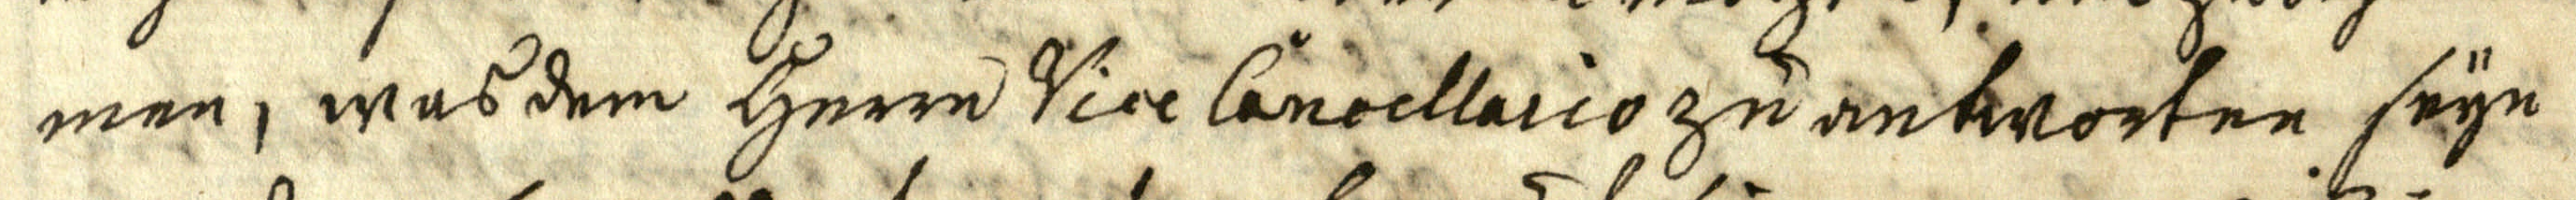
man, was dem Herrn Vice Cancellario zu antworten seÿn
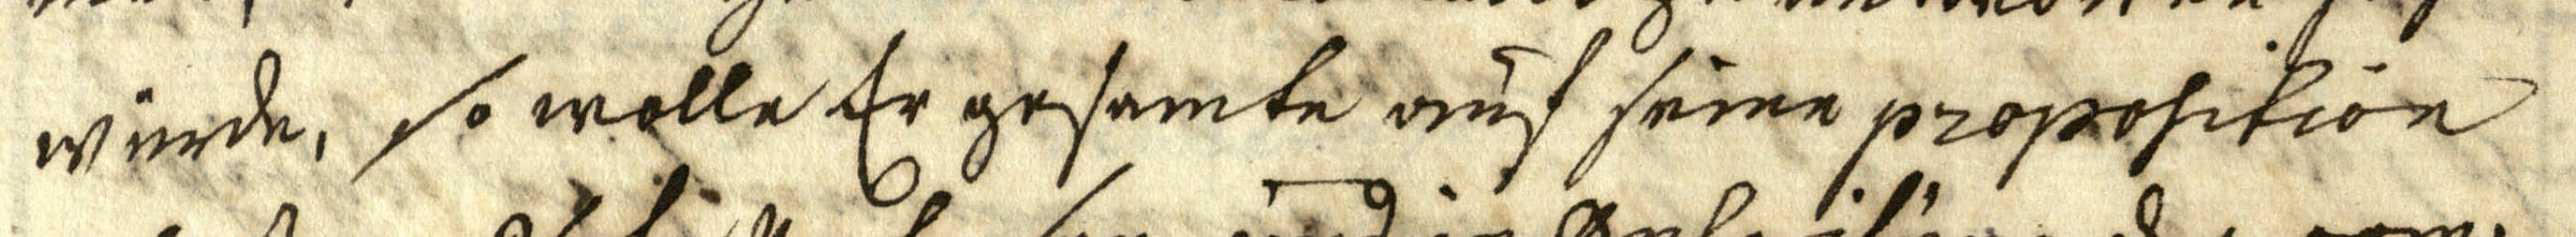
würde, so wolle Er gesamte auf seine proposition
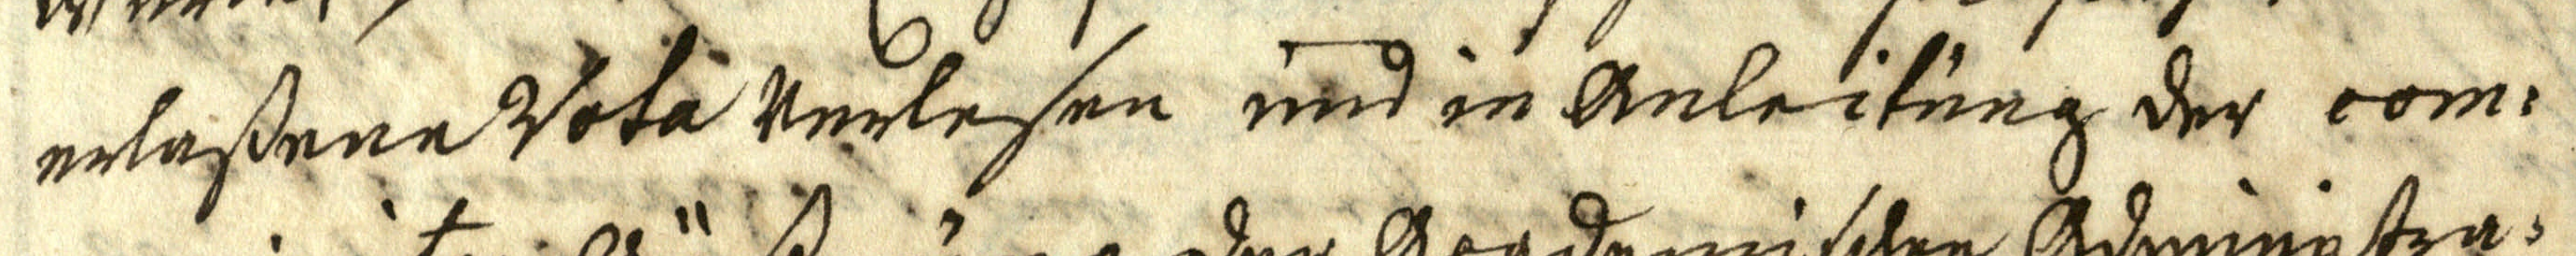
erlaßene Vota verlesen und in Anleitung der com¬
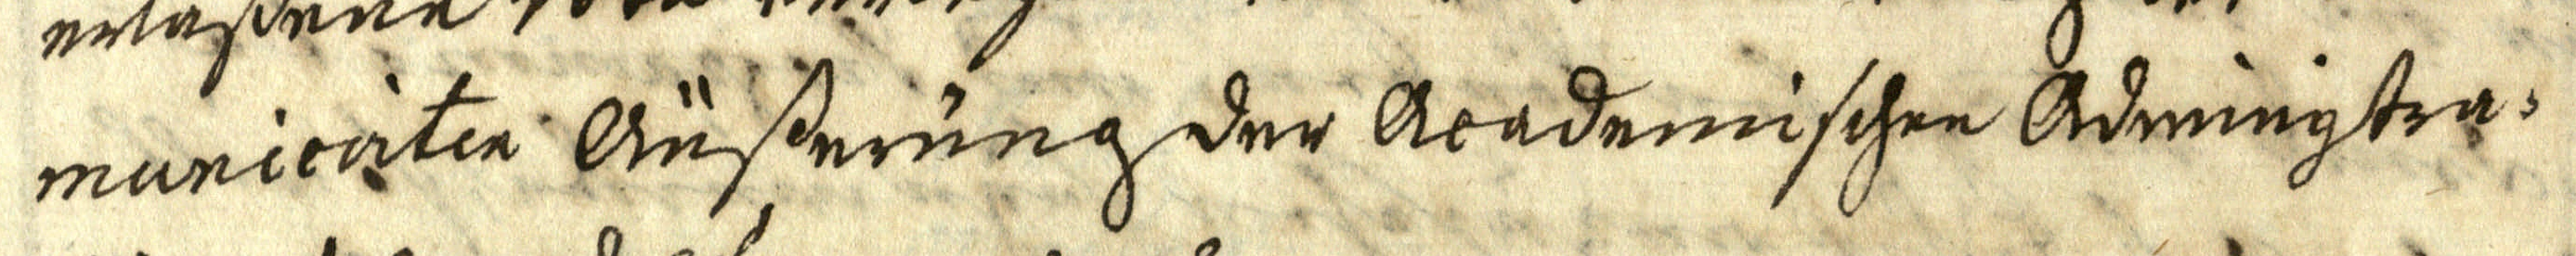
municirten Äußerung der Academischen Administra¬
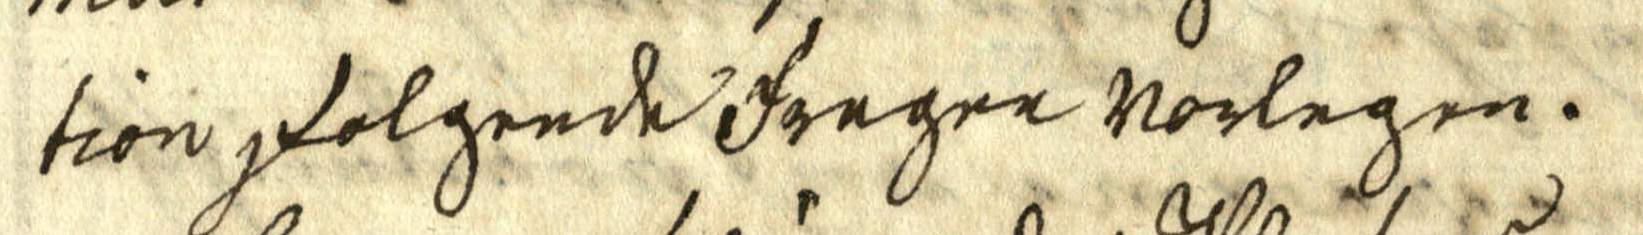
tion folgende Fragen vorlegen.
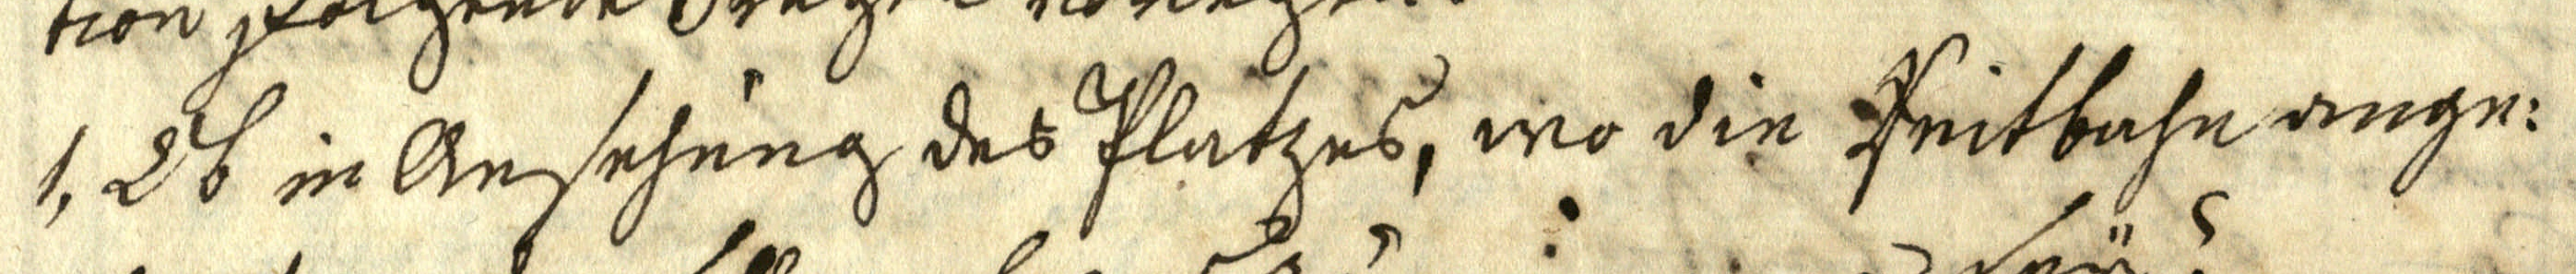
1 Ob in Ansehung des Platzes, wo die Reitbahn ange¬
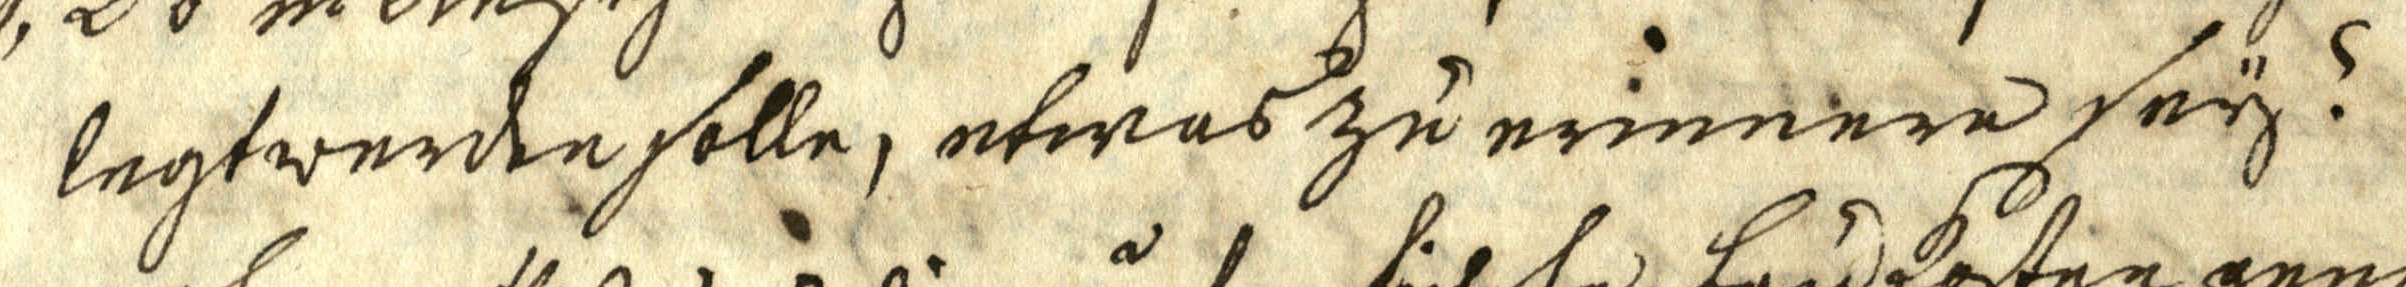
legt werden solle, etwas zu erinnern seÿ?
